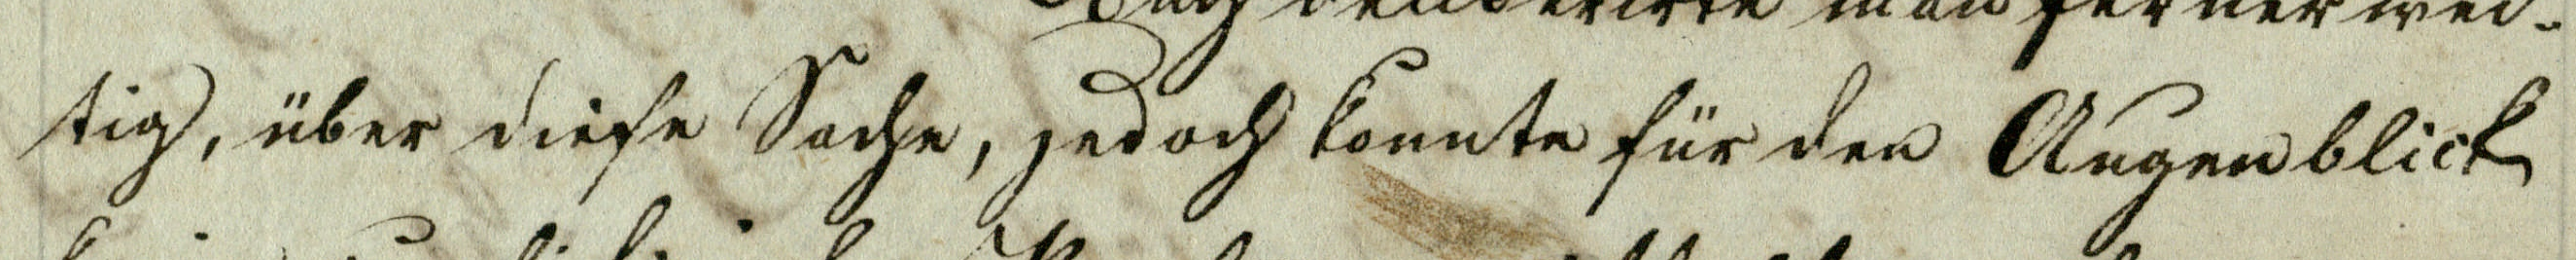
tig, über diese Sache, jedoch könnte für den Augenblick
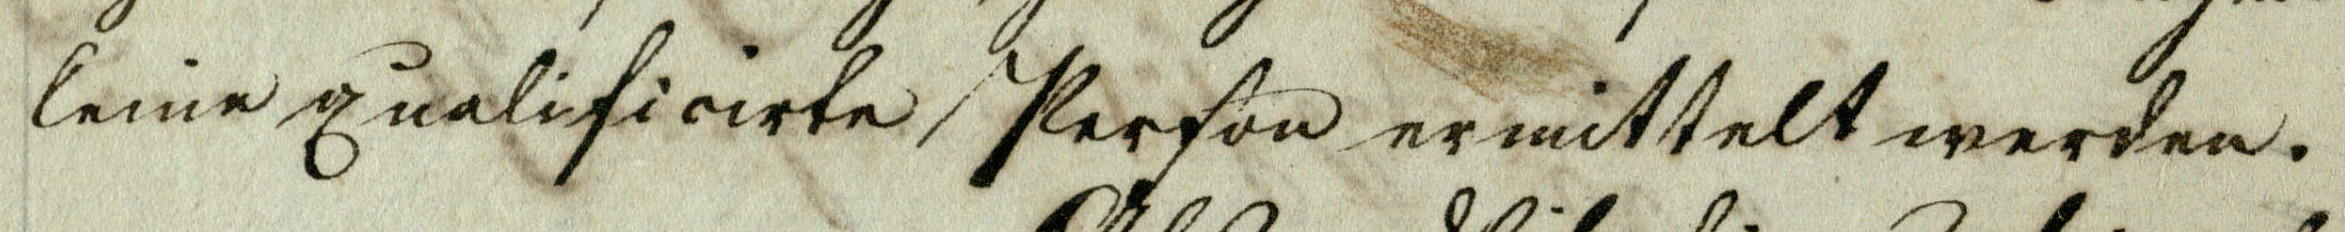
keine qualificirte Person ermittelt werden.
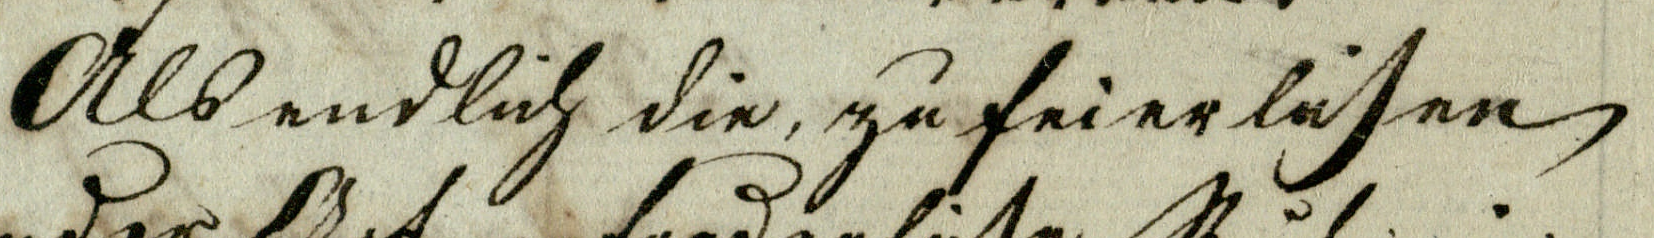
Als endlich die, zu feierlichen
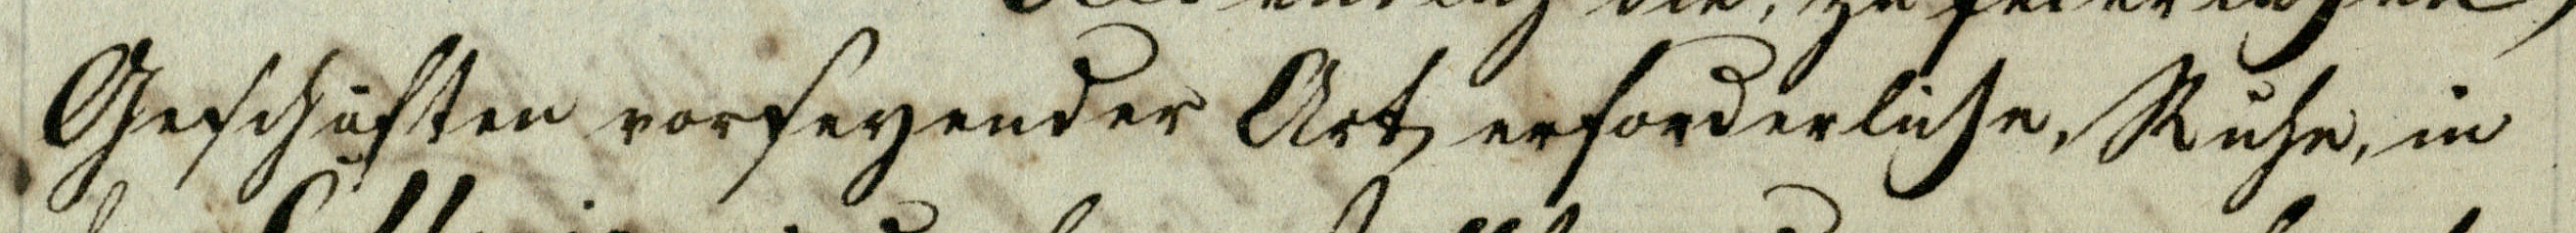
Geschäften vorseyender Art, erforderliche Ruhe, in
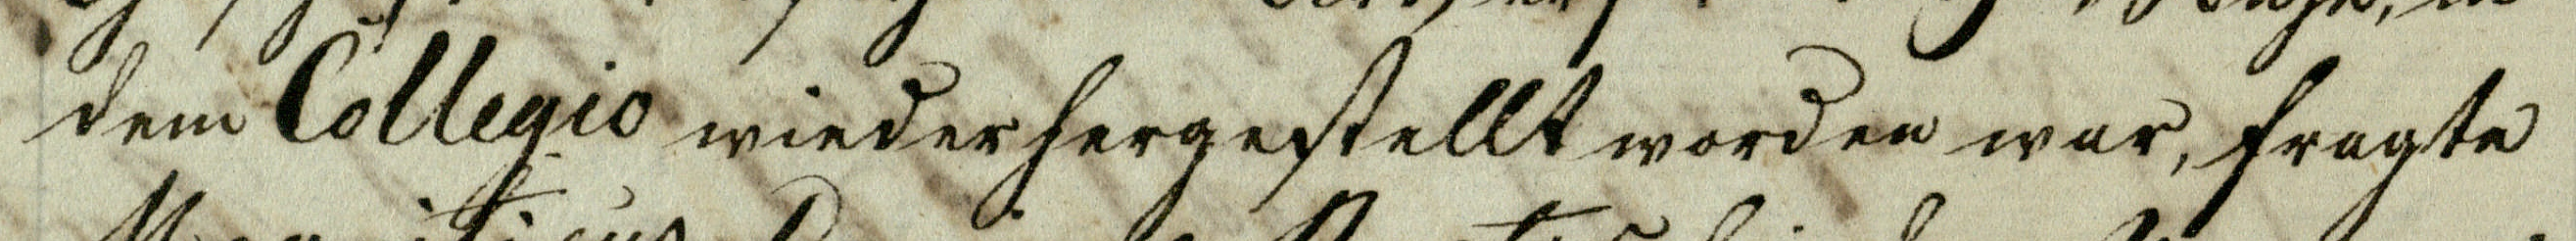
dem Collegio wiederhergestellt worden war, fragte
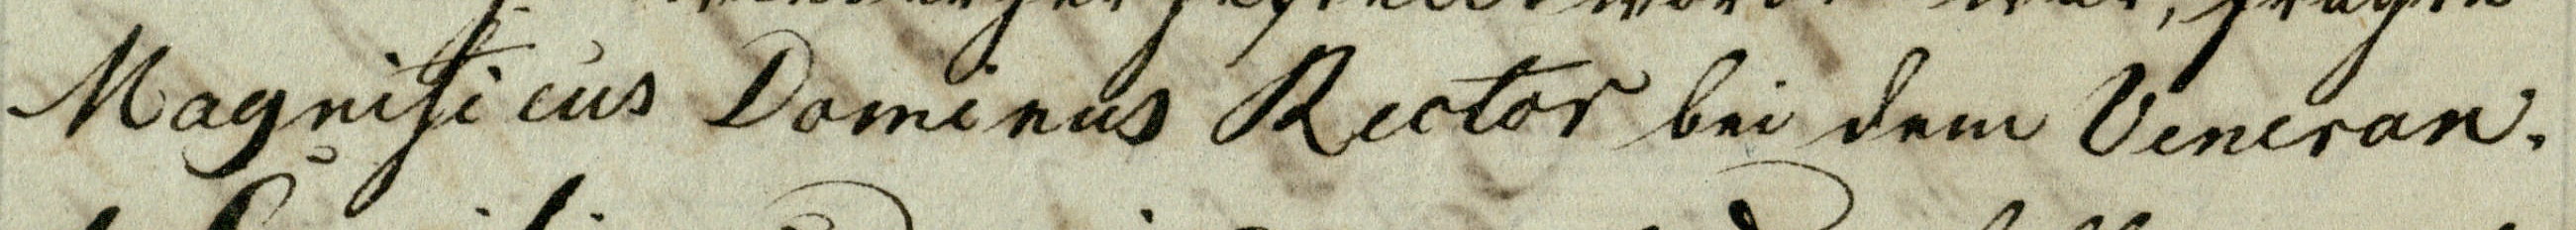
Magnificus Dominus Rector bei dem Veneran¬
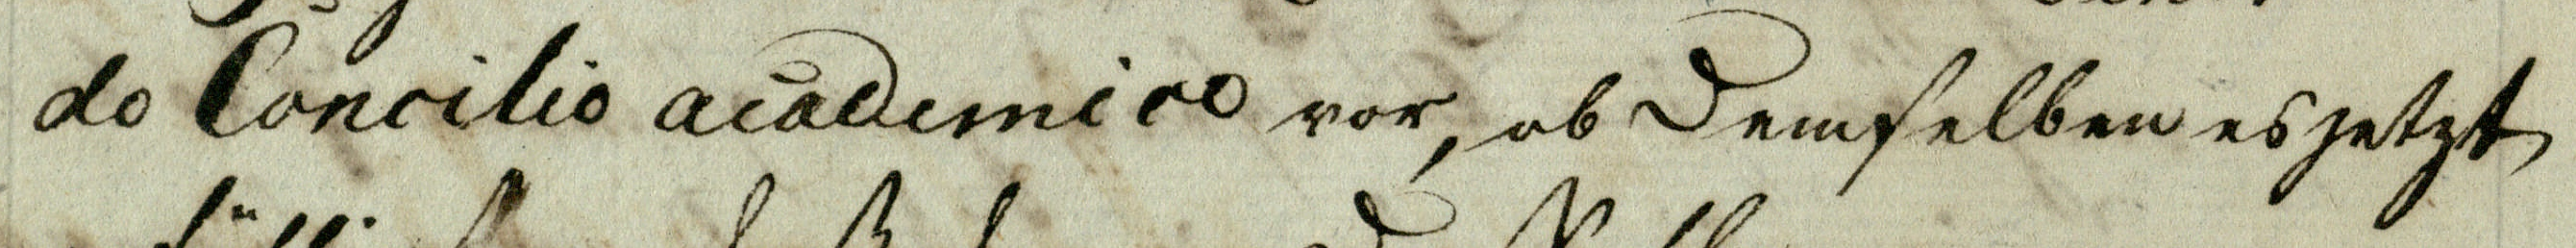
do Concilio academico vor, ob demselben es jetzt,
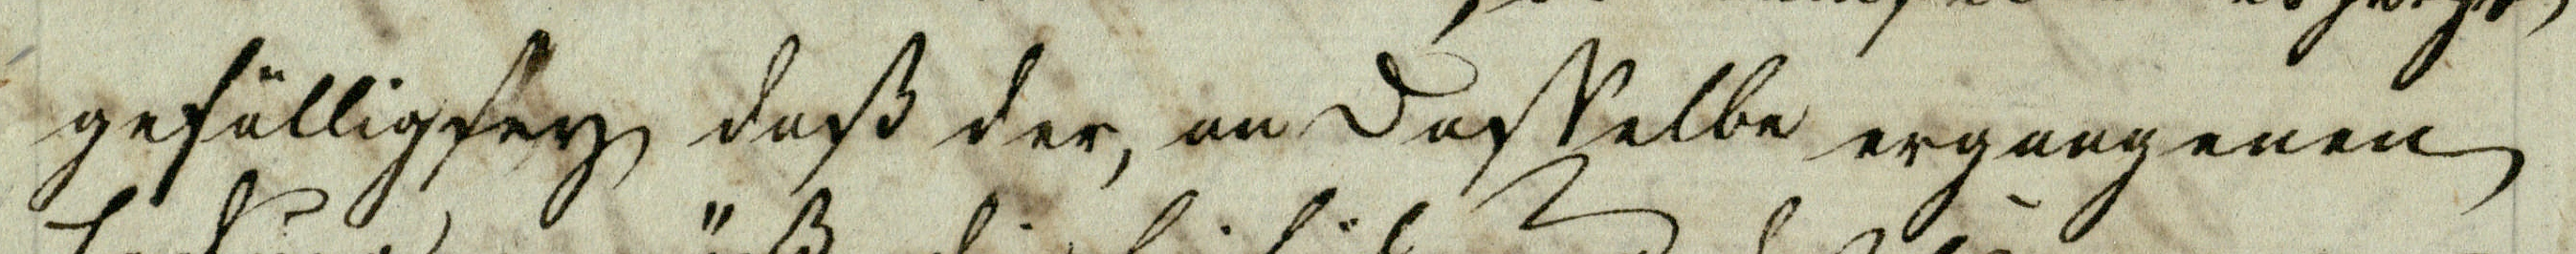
gefällig sey, daß der, an dasselbe ergangenen
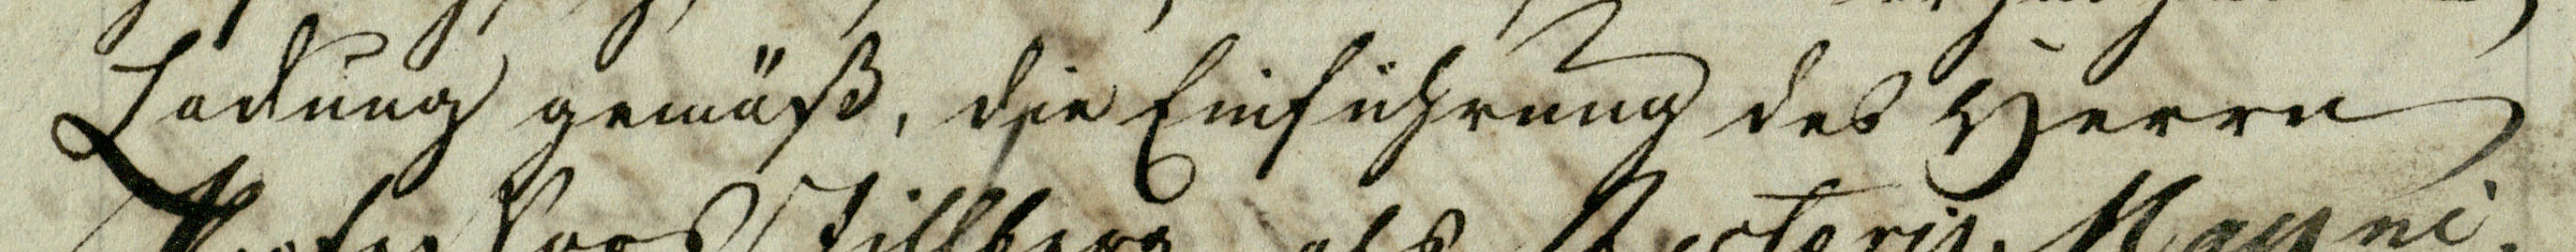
Ladung gemäß, die Einführung des Herrn
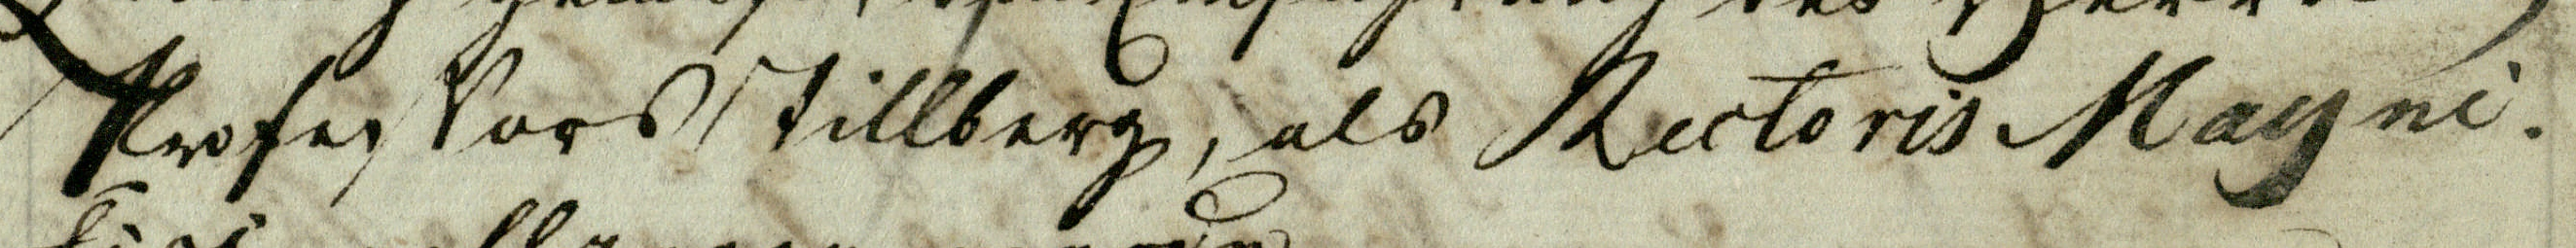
Professors Tillberg, als Rectoris Magni¬
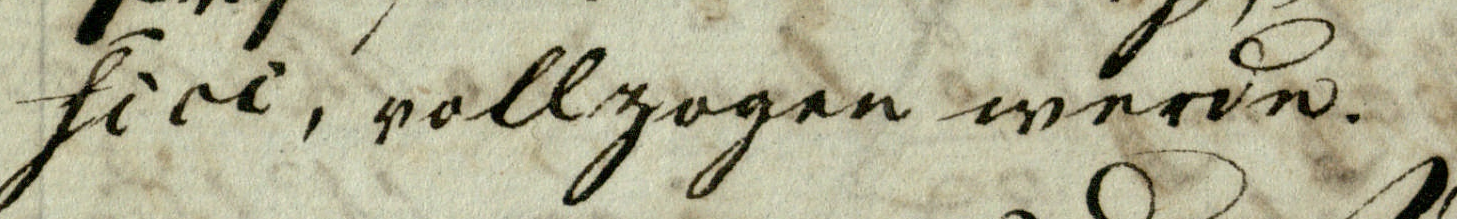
fici, vollzogen werde.
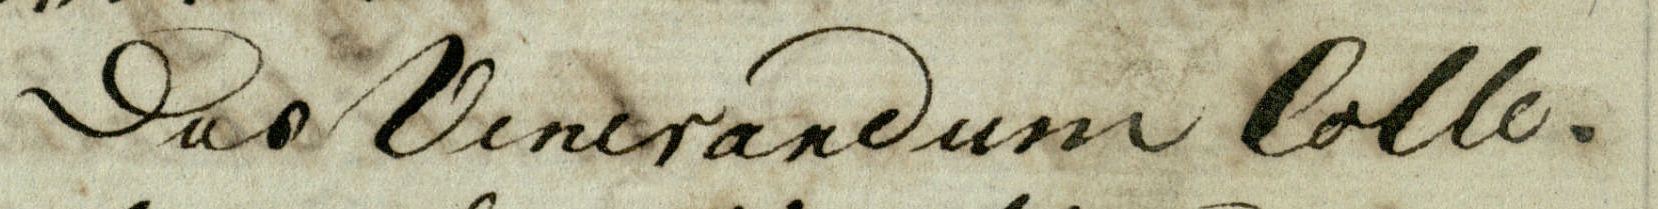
Das Venerandum Colle¬
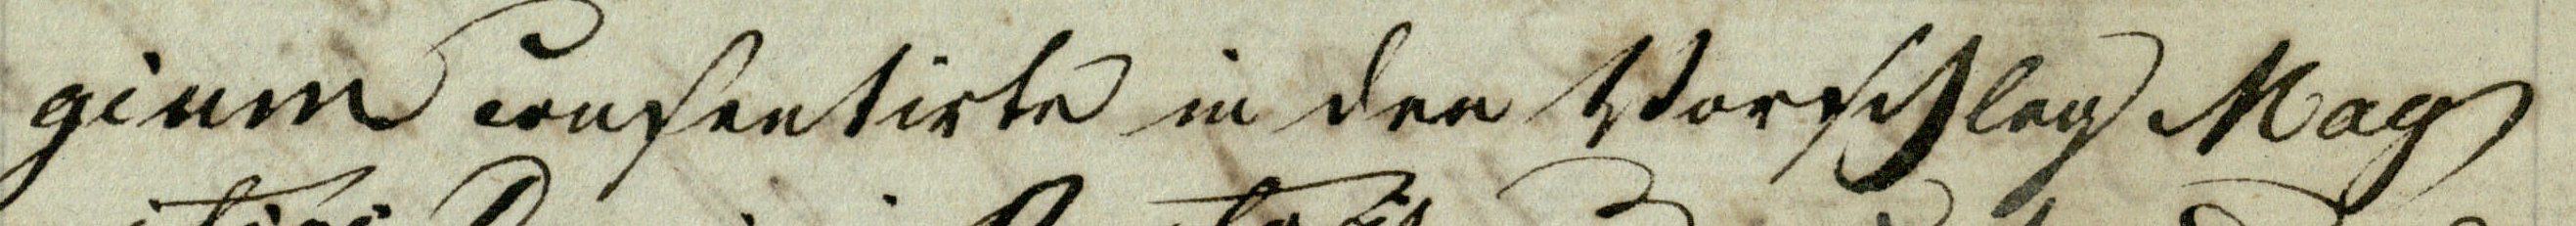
gium consentirte in den Vorschlag Mag¬
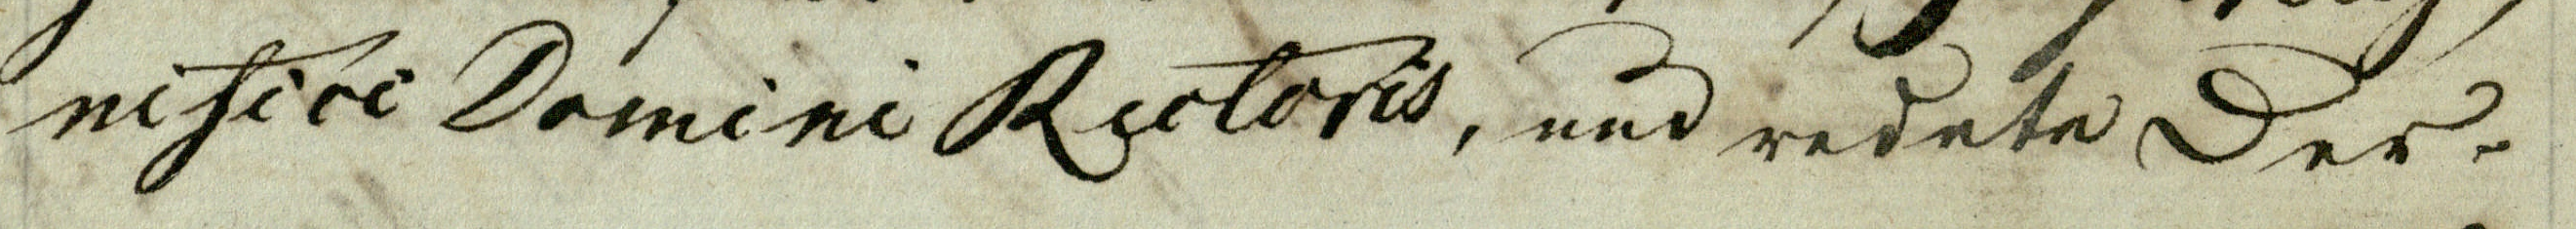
nifici Domini Rectoris, und redete Der¬
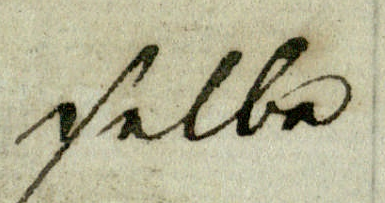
selbe
